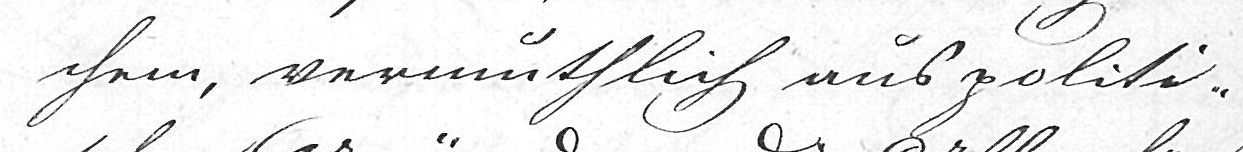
chen, vermuthliche aus politi-
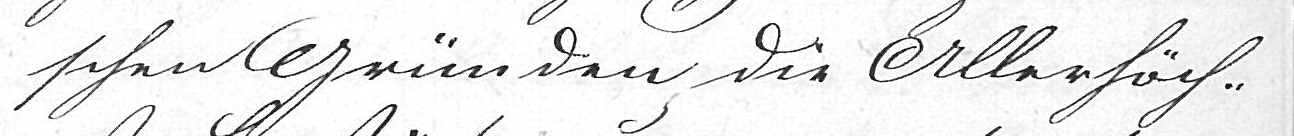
schen Gründen die Allerhöch-
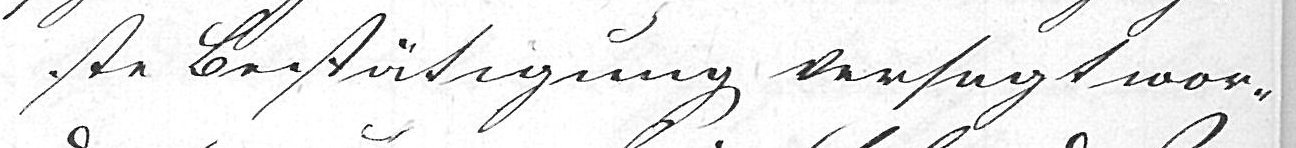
ste Bestätigiung versagt wor-
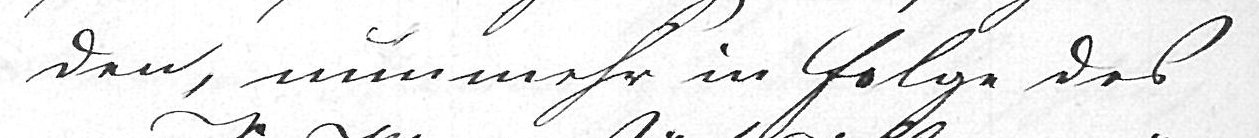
den, nunmehr in Folge des
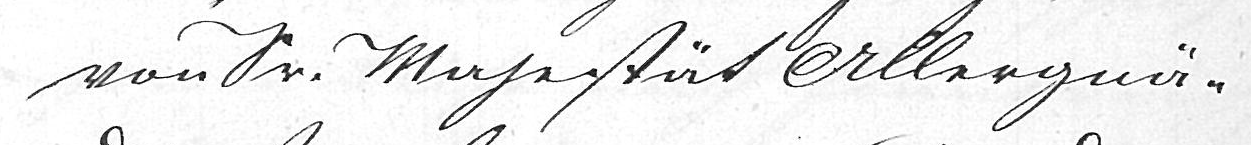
von Sr. Majestät Allergnä-
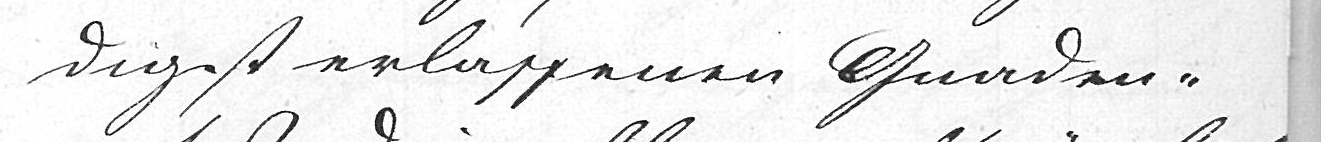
digst erlassenen Gnaden-
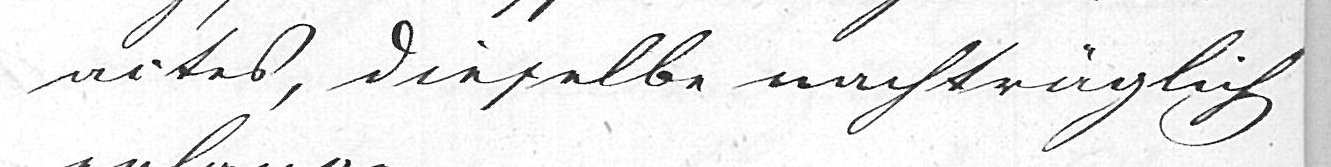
actes, dieselbe nachträglich
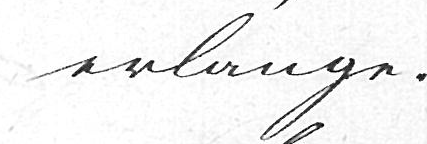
erlange.
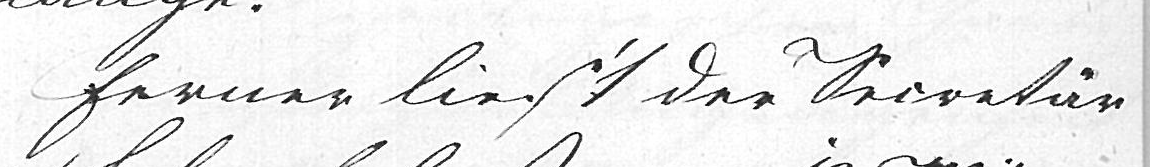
Ferner liest derSecretär
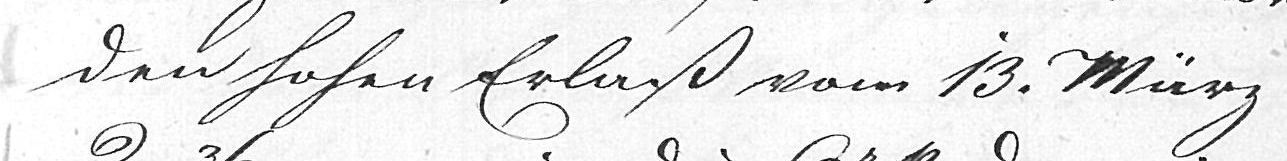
den hohen Erlaß vom 13. März
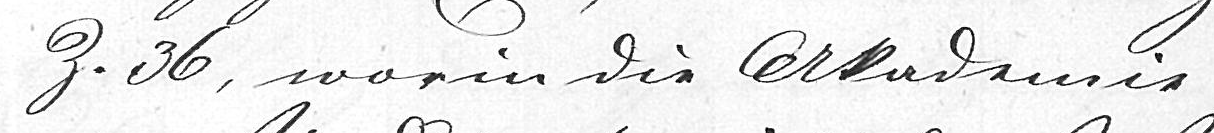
Z. 36, worin die Akademie
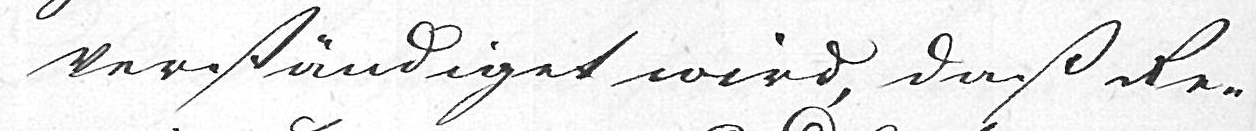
verständiget wird, daß Re-
